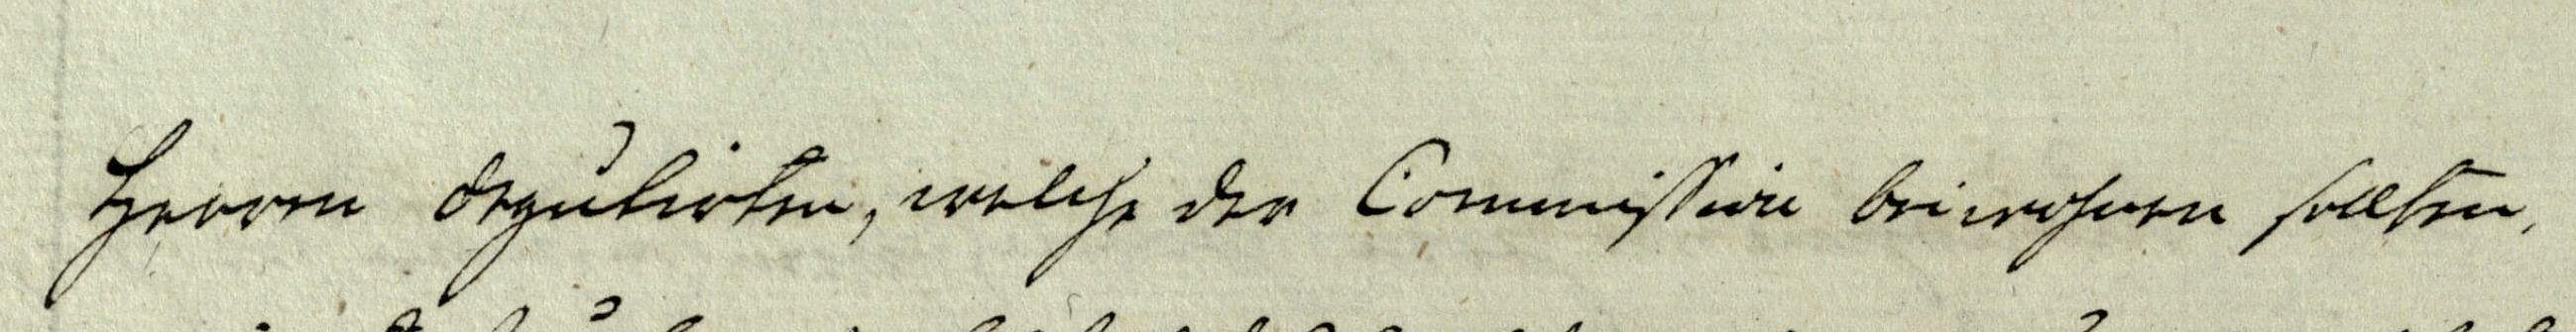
Herren Deputirten, welche der Commission beiwohnen sollten,
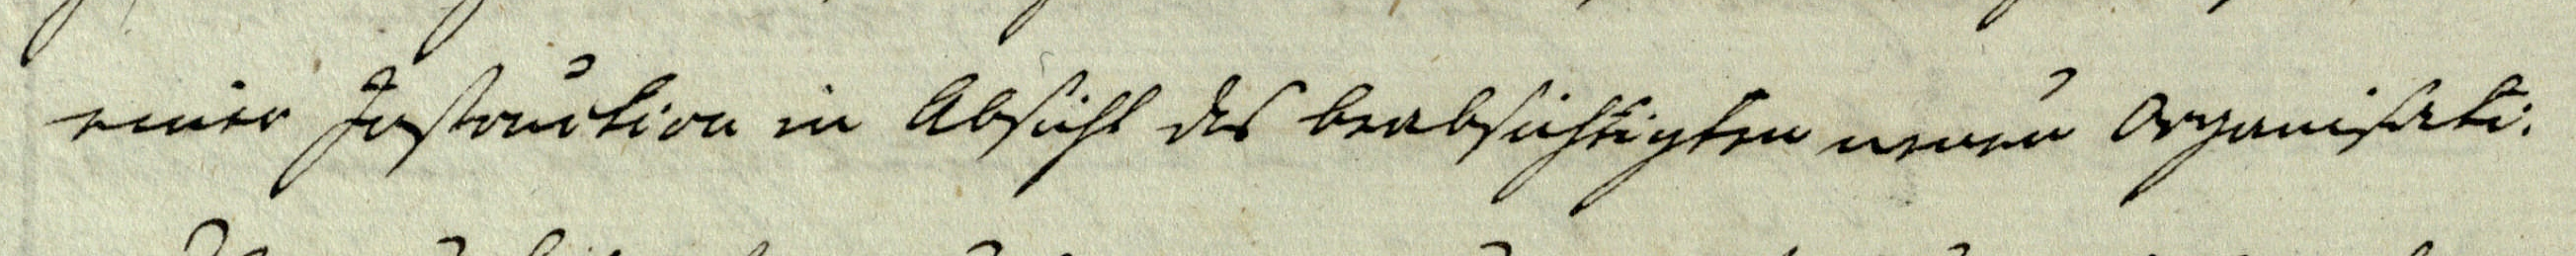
einer Instruction in Absicht des beabsichtigten neuen Organisati¬
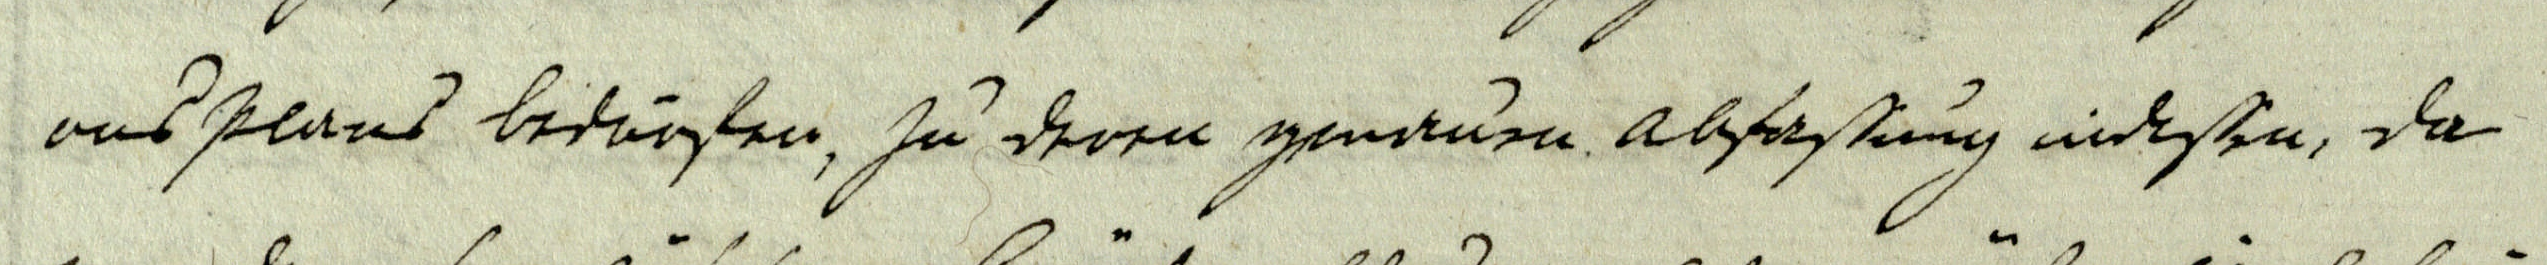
ons Plans bedürfen, zu deren genauen Abfassung indessen, da
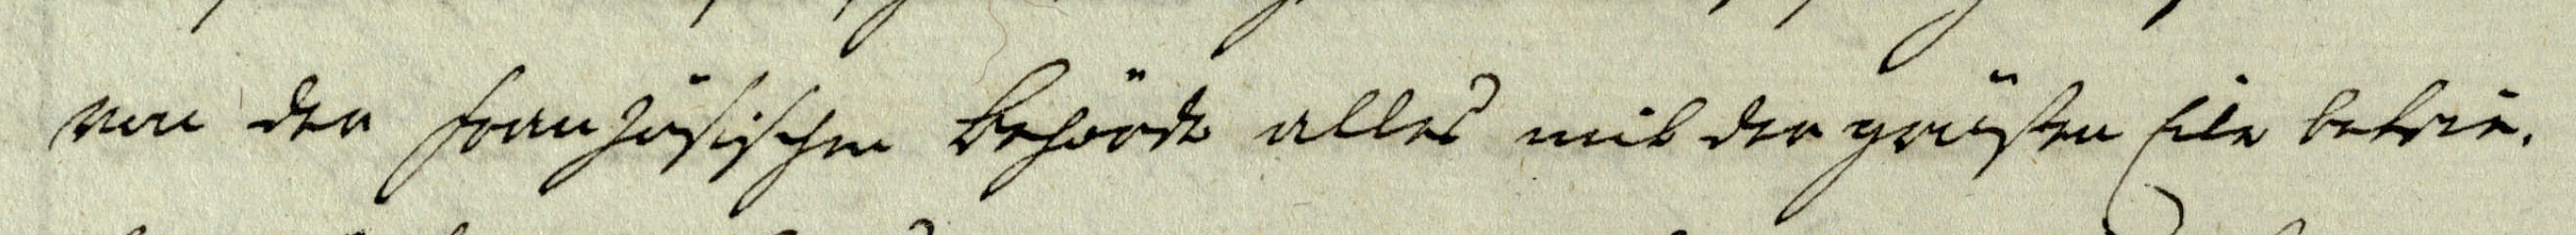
von der Französischen Behörde alles mit der grösten Eile betrie¬
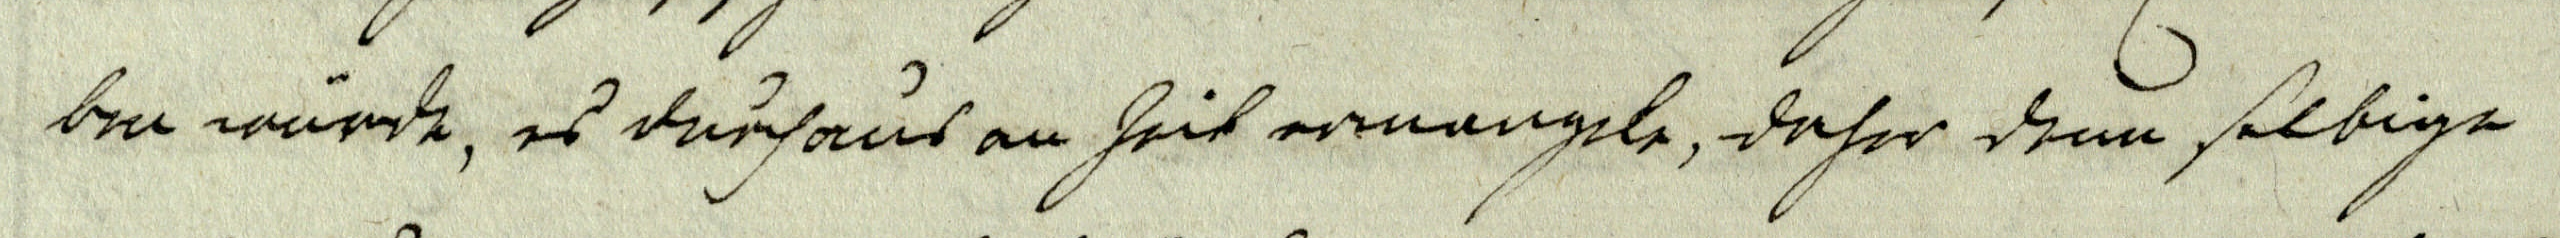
ben würde, es durchaus an Zeit ermangele, daher denn selbige
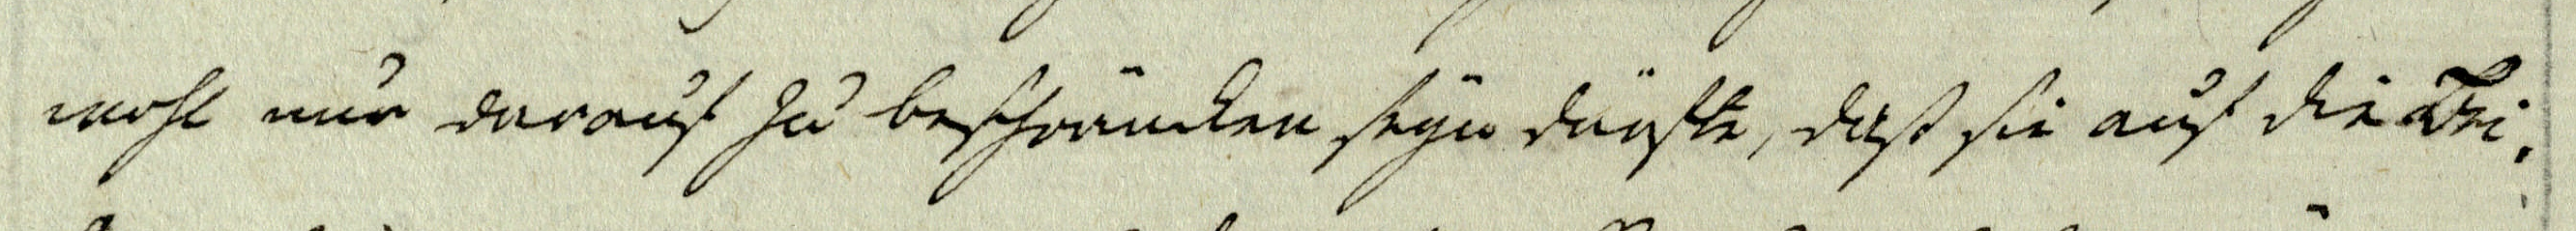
wohl nur darauf zu beschränken seÿn dürfte, daß sie auf die Bei¬
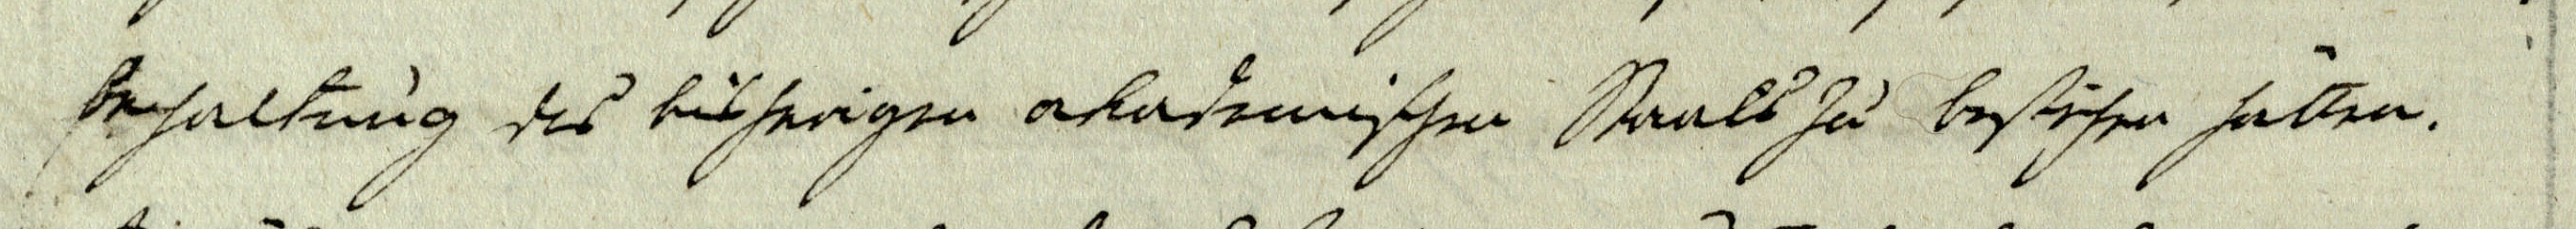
behaltung des bisherigen akademischen Staats zu bestehen hätten.
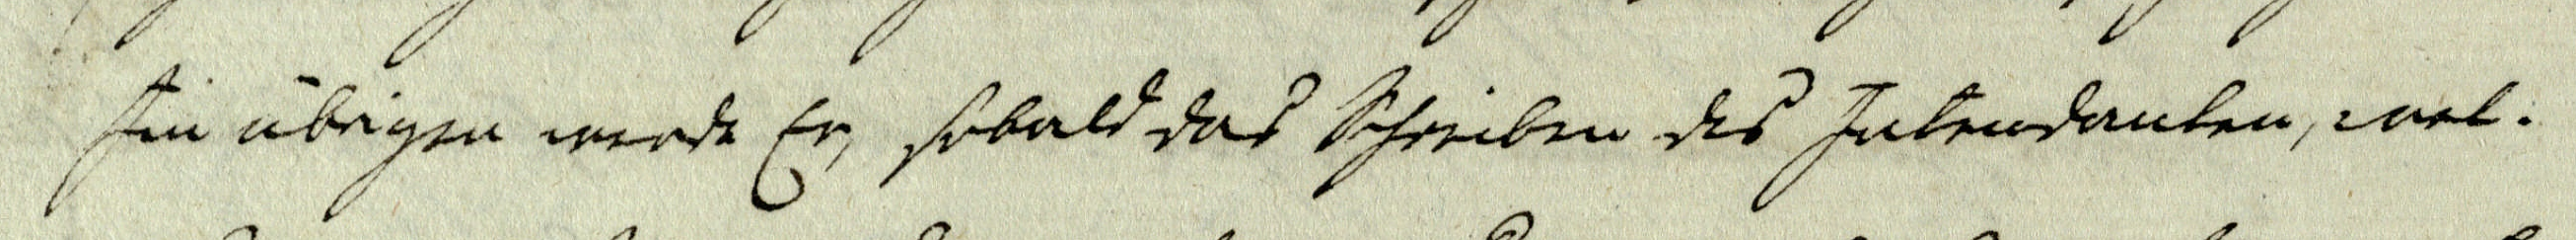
Im übrigen werde Er, sobald das Schreiben des Intendanten, wel¬
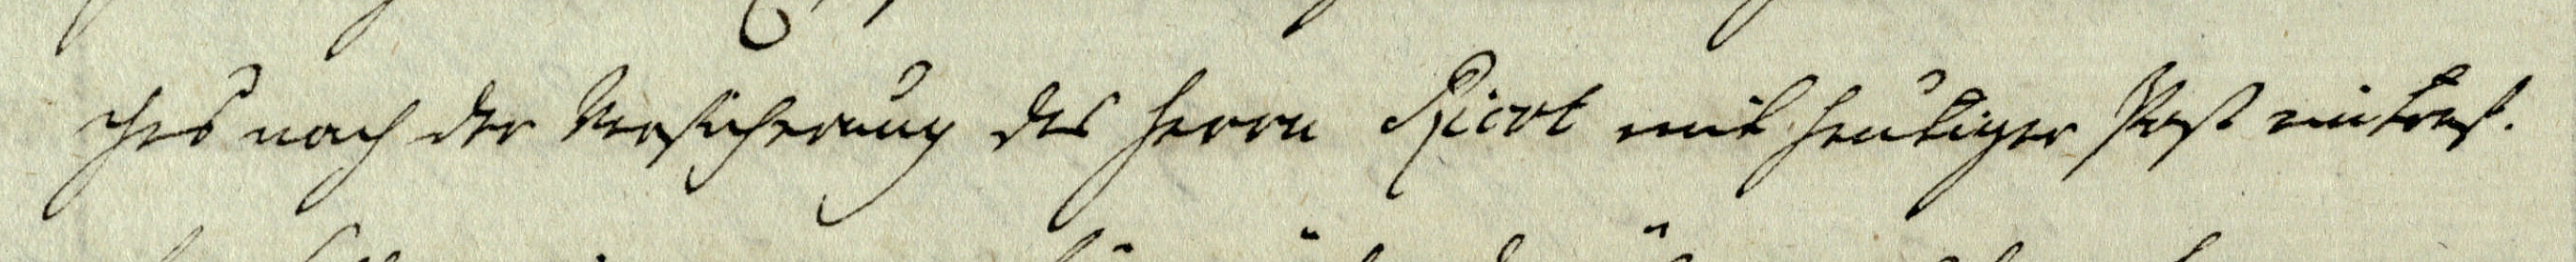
ches nach der Versicherung des Herrn Ricot mit heutiger Post eintref¬
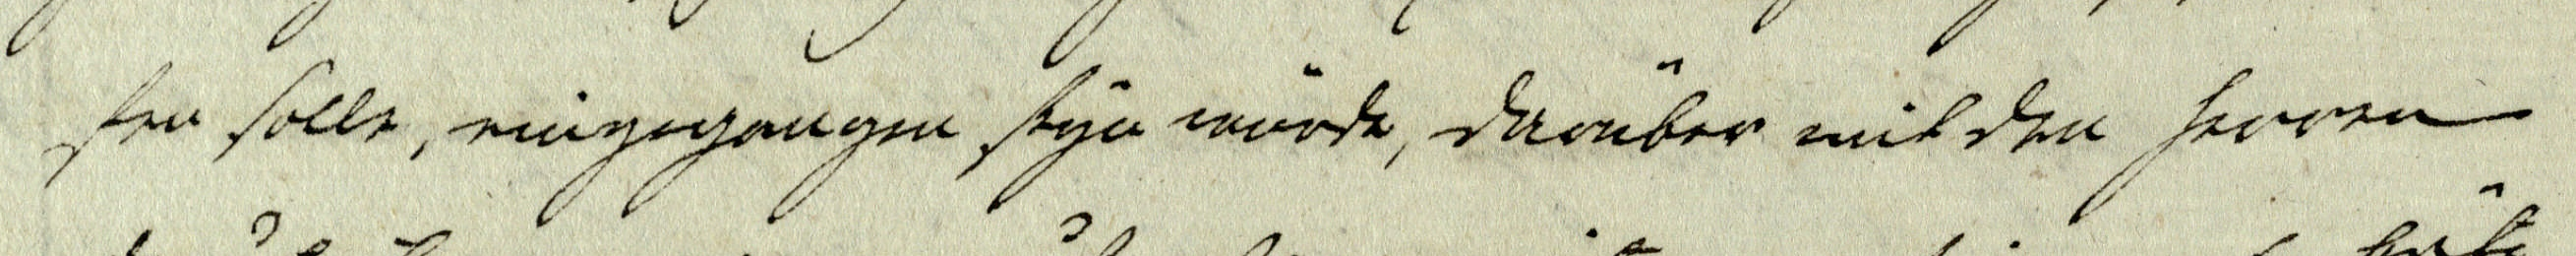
fen solle, eingegangen seÿn würde, darüber mit den Herren
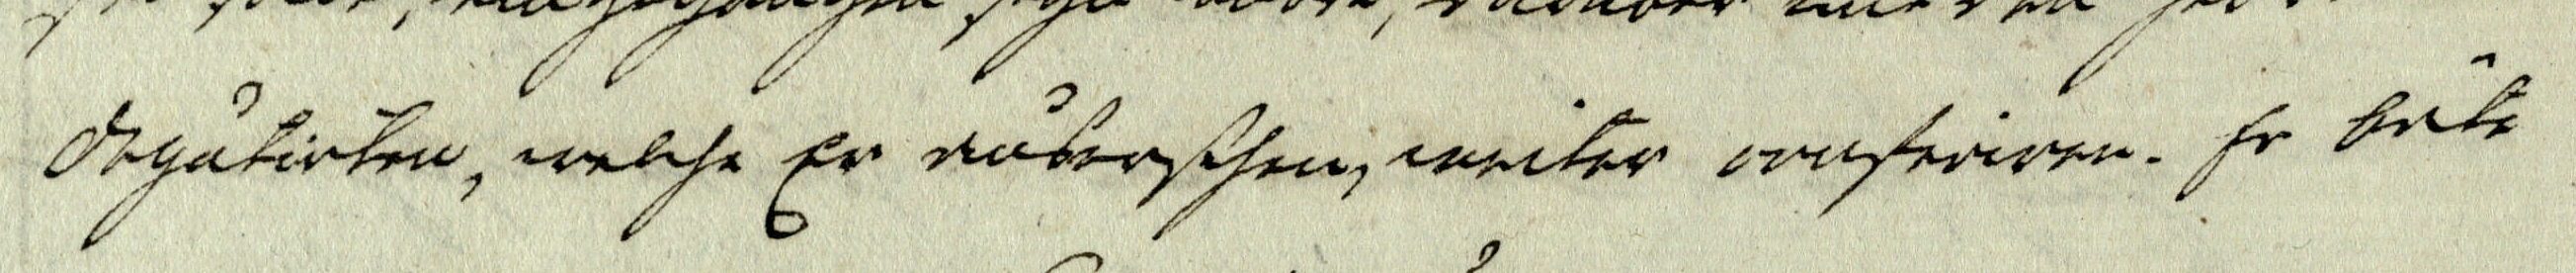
Deputirten, welche Er ausersehen, weiter conferiren. Er bäte
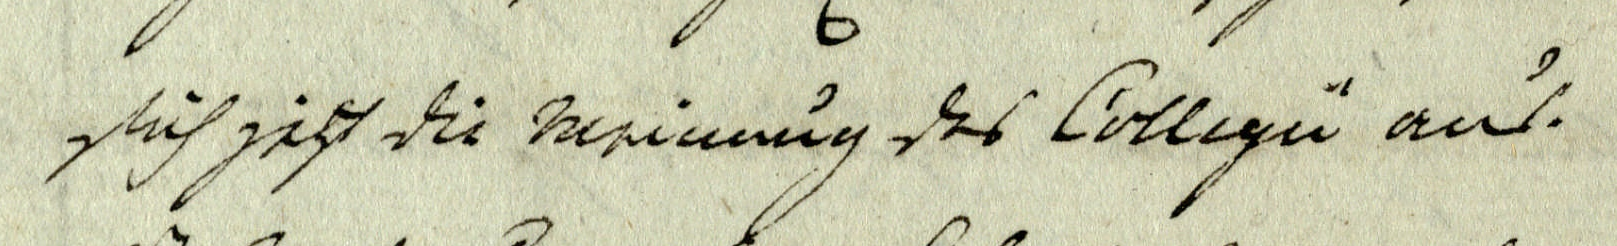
sich jetzt die Meinung des Collegii aus.
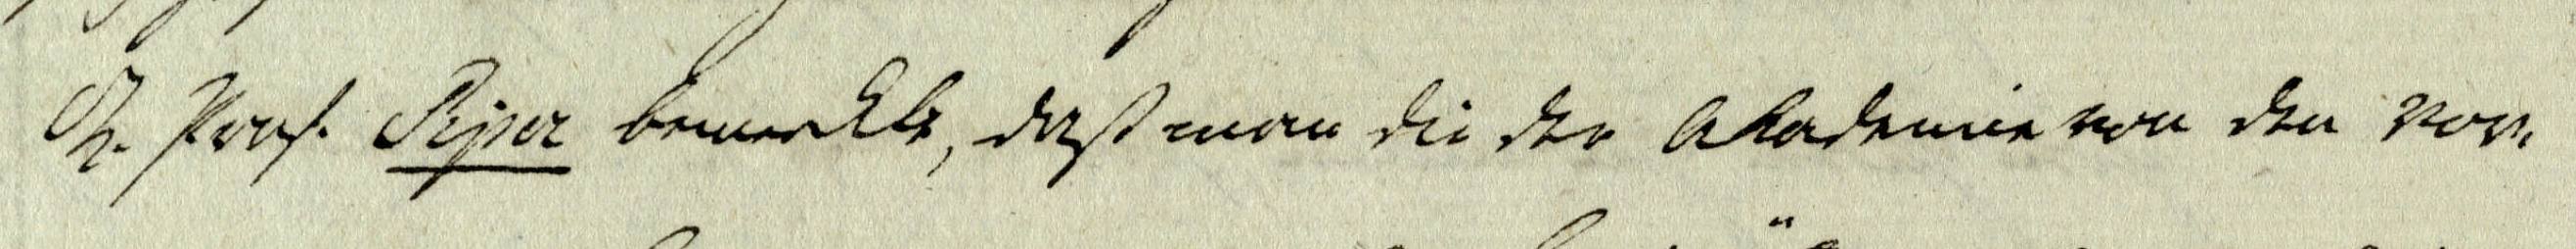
dh. Prof. Piper bemerkte, daß man die der Akademie von den vor¬
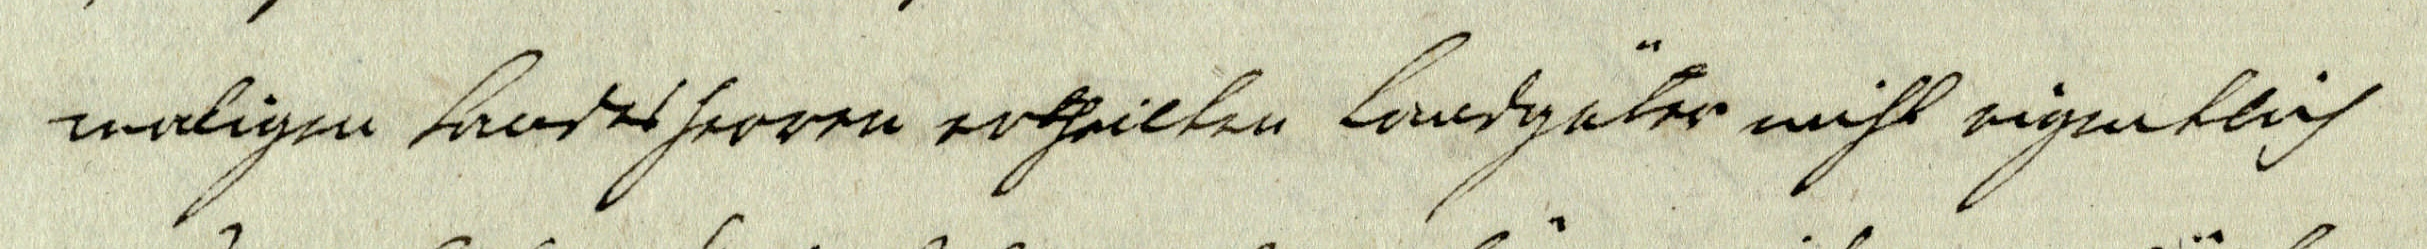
maligen LandesHerren ertheilten Landgüter nicht eigentlich
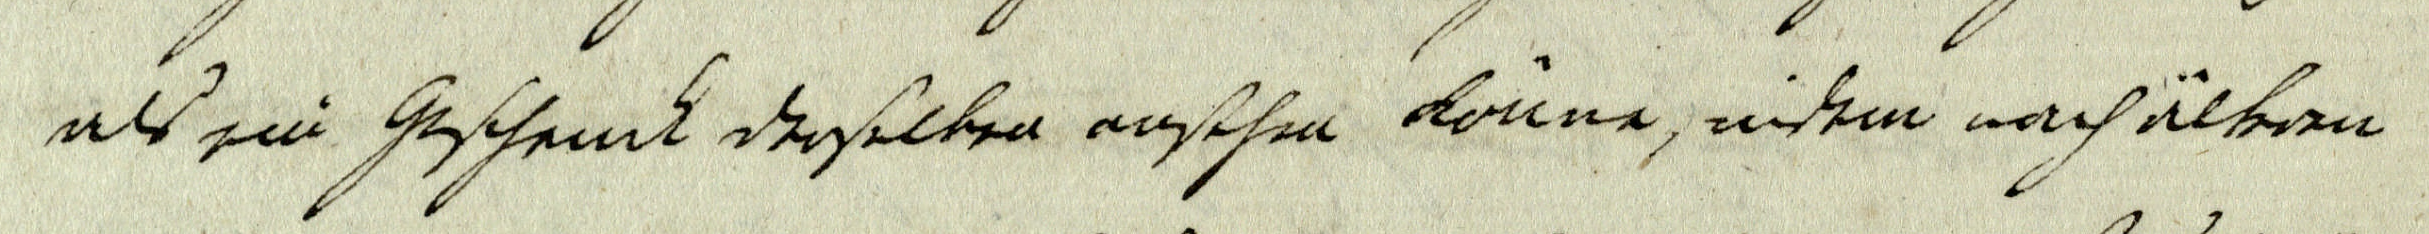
als ein Geschenk derselben ansehen könne, indem nach älteren
